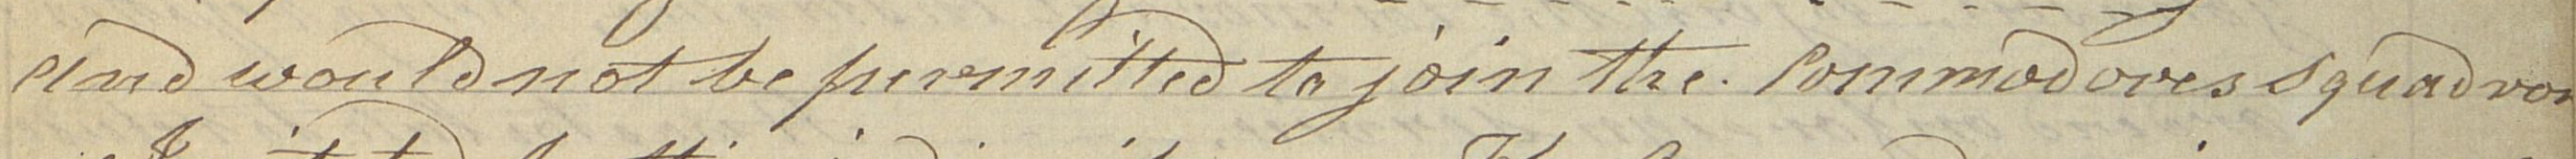and would not be permitted to join the commodores squadron
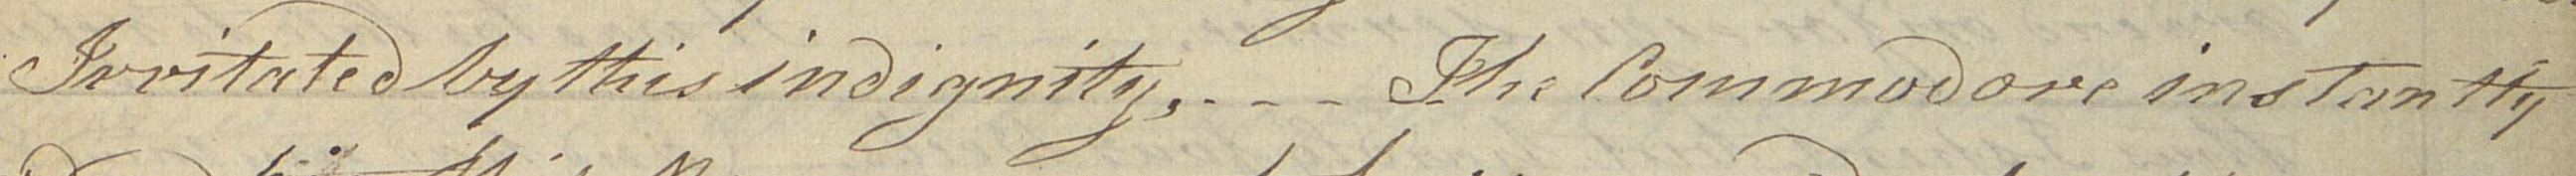Irritated by this indignity, Th Commodore instantly
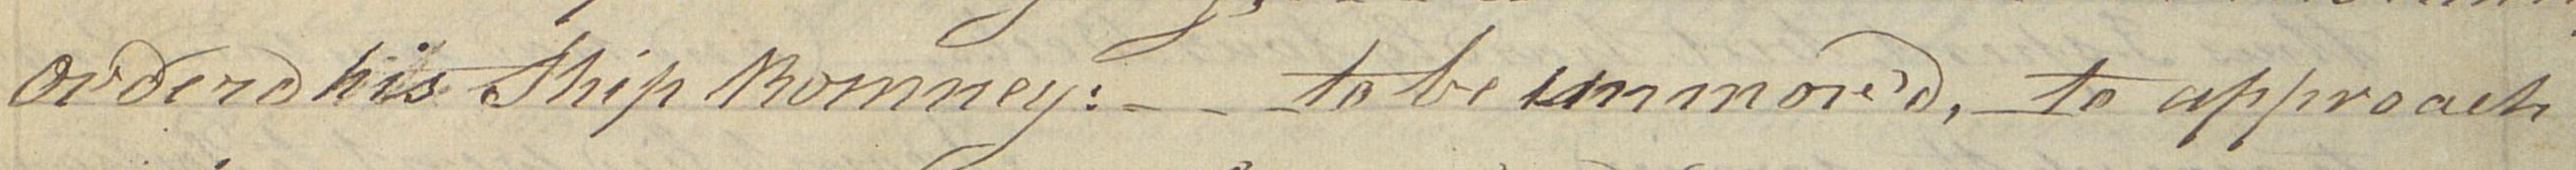orderd his Ship Romney: to be unmor'd, to approach
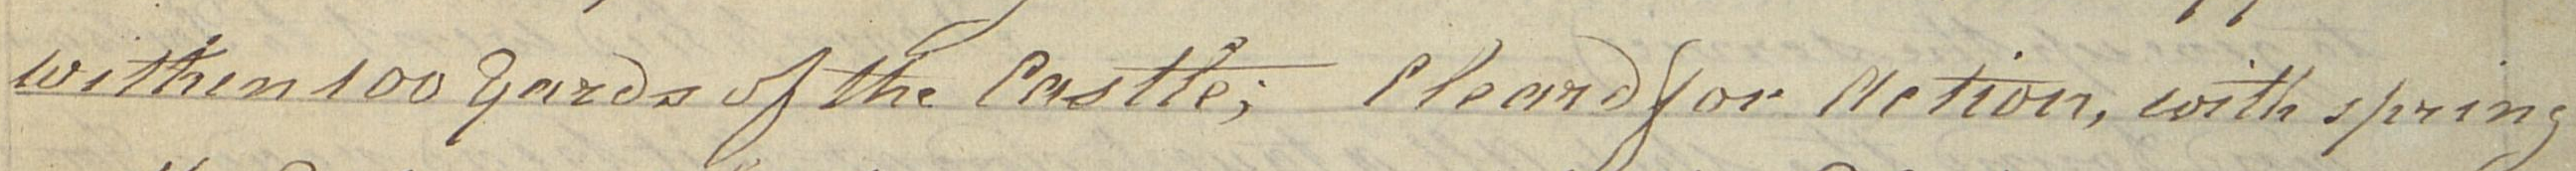within 100 yards of the Castle; Cleard for Action, with spring
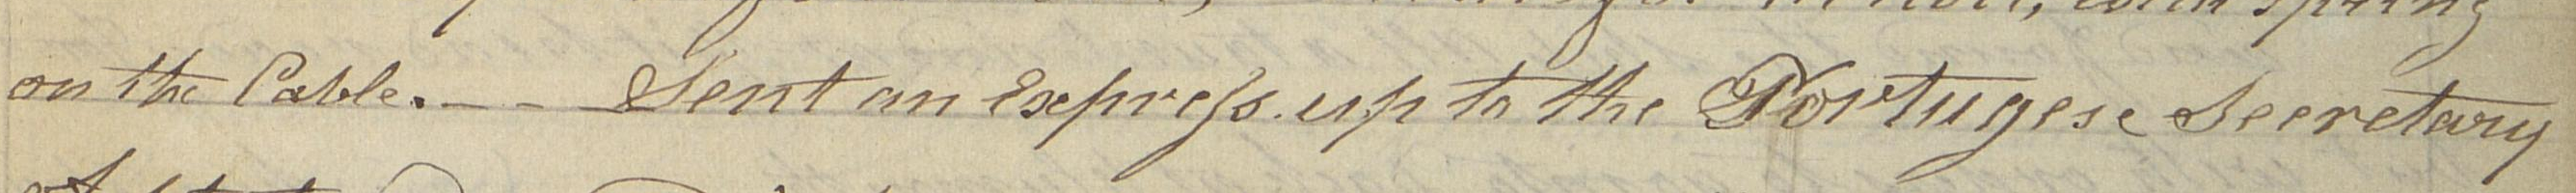on the Cable. Sent an Express up to the Portugese Secretary
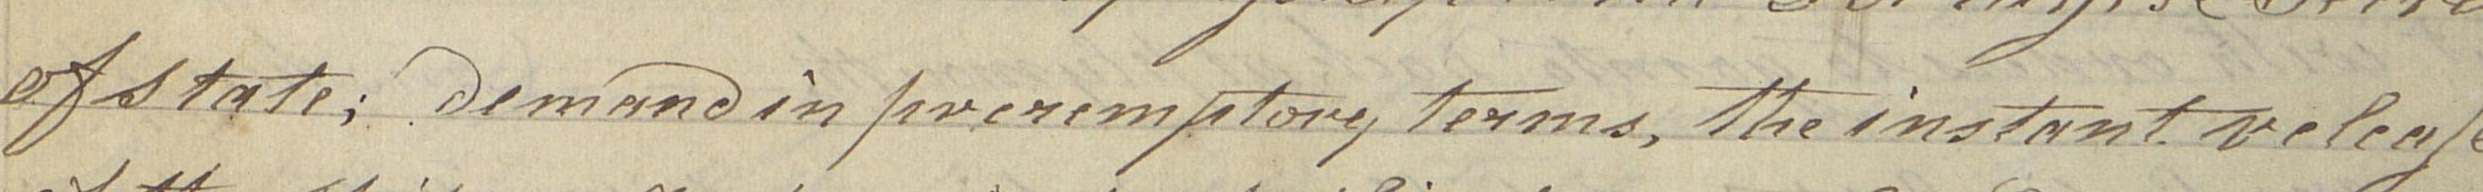of state; demand in preremptory terms, the instant release
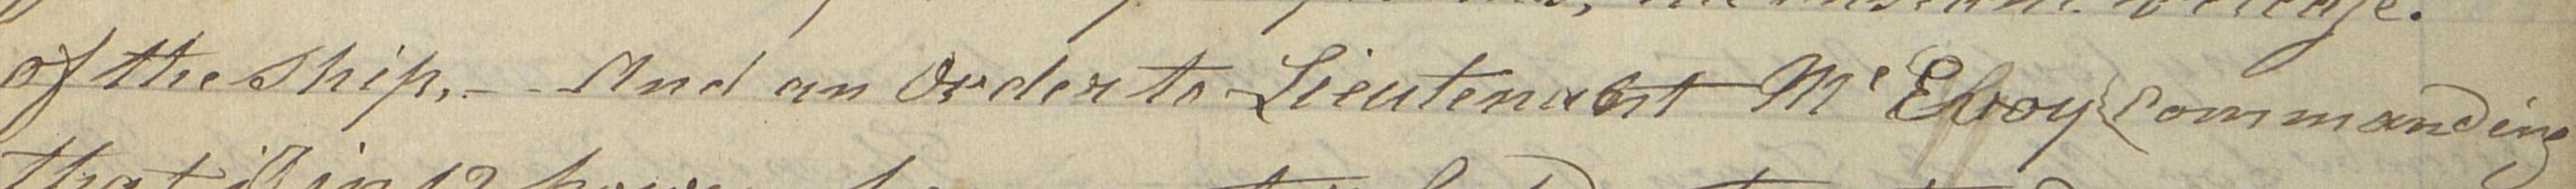of the Ship. And an Order to Lieutenant M^cEvoy (Commanding
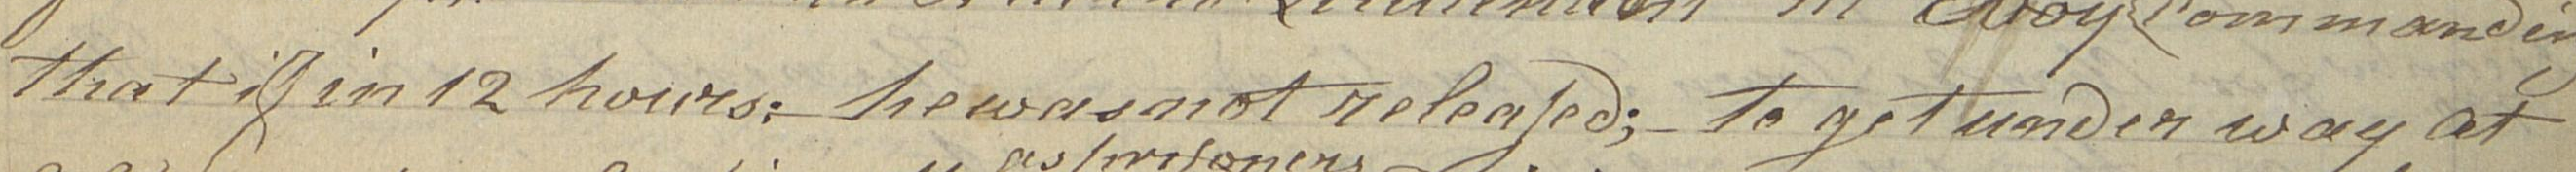that if in12 hours: he was not released; to get under way at
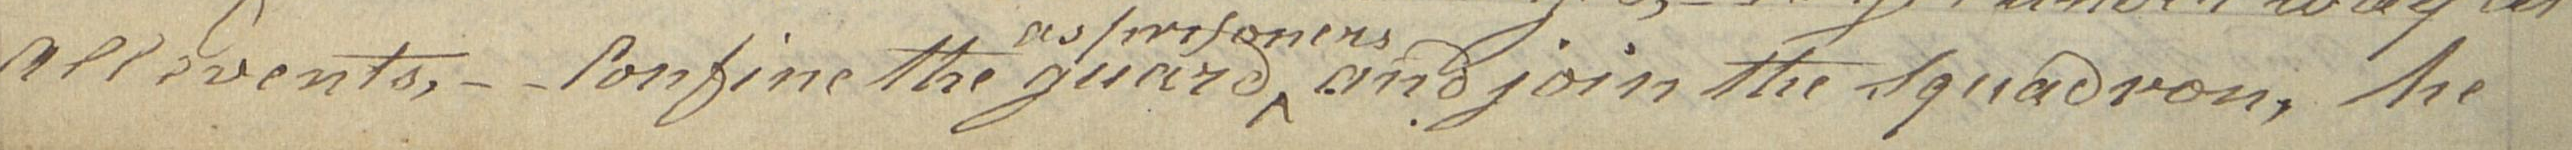all events, Confine the guard ^ and join the Squadron, he
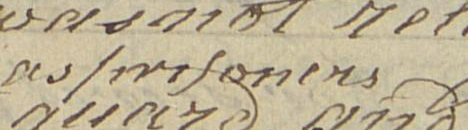as prisoners
